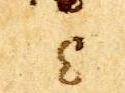3
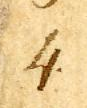4
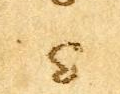3
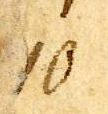10
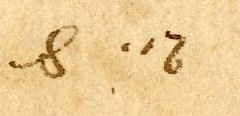2.. 8
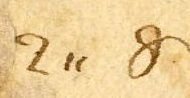2.. 8
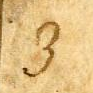3
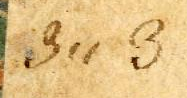3.. 3
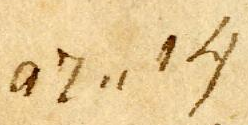97.. 14
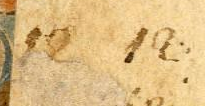12 12
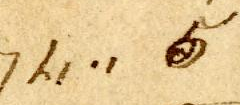74.. 5
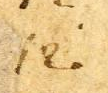12
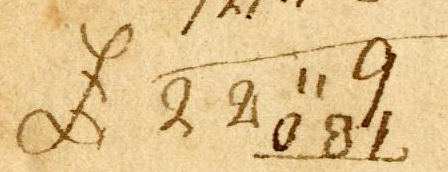£ 22..9
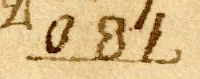1 8 0
